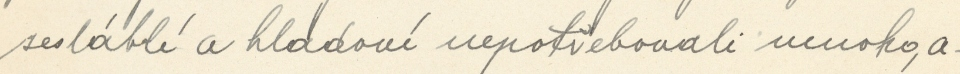sesláblí a hladoví nepotřebovali mnoho, a-
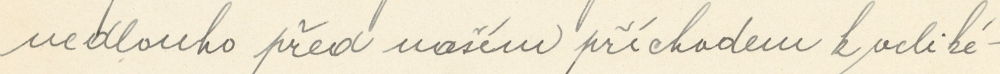nedlouho před naším příchodem k veliké-
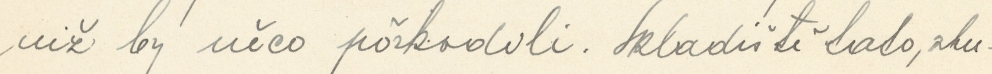niž by něco poškodili. Skladiště tato, zbu-
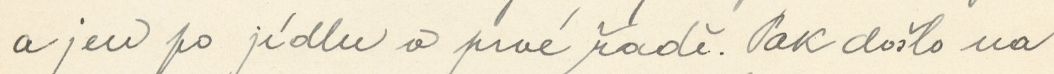a jen po jídlu v prvé řadě. Pak došlo na
